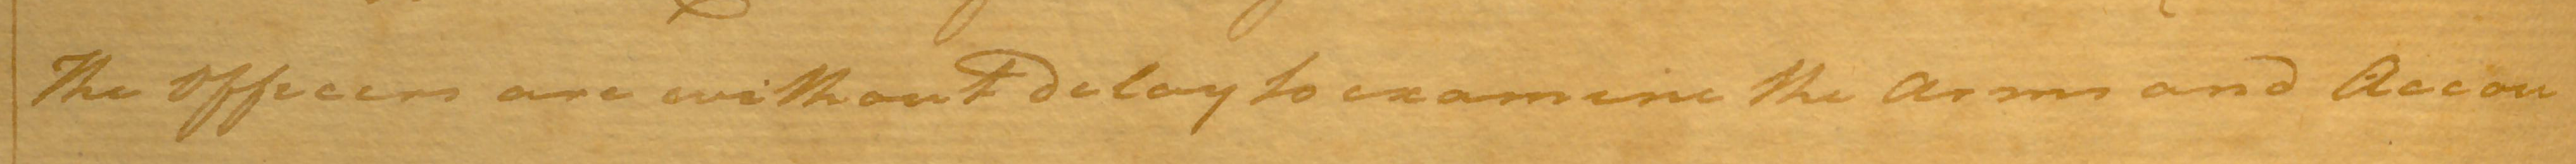The Officers are without delay to examine the arms and Accou
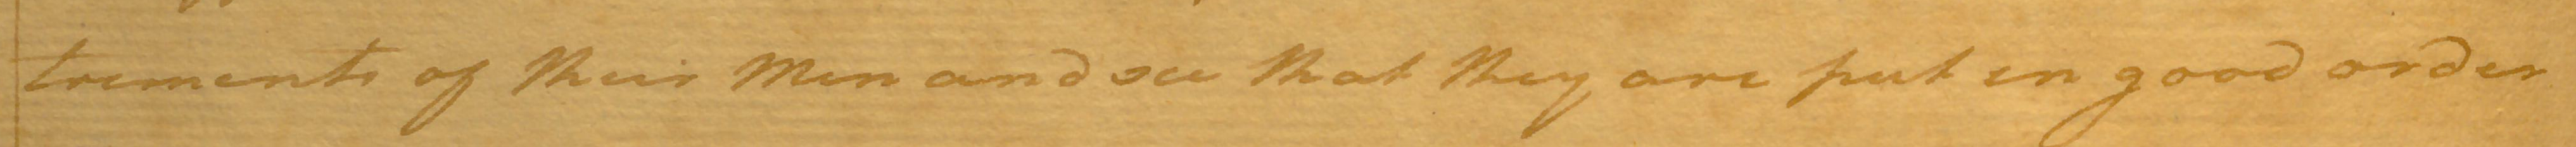trements of their Men and see that they are put in good order
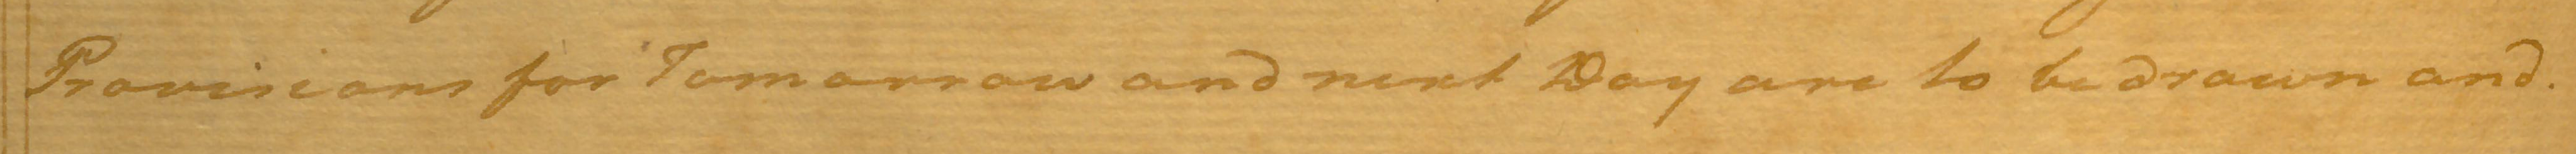Provisions for Tomorrow and next day are to be drawn and
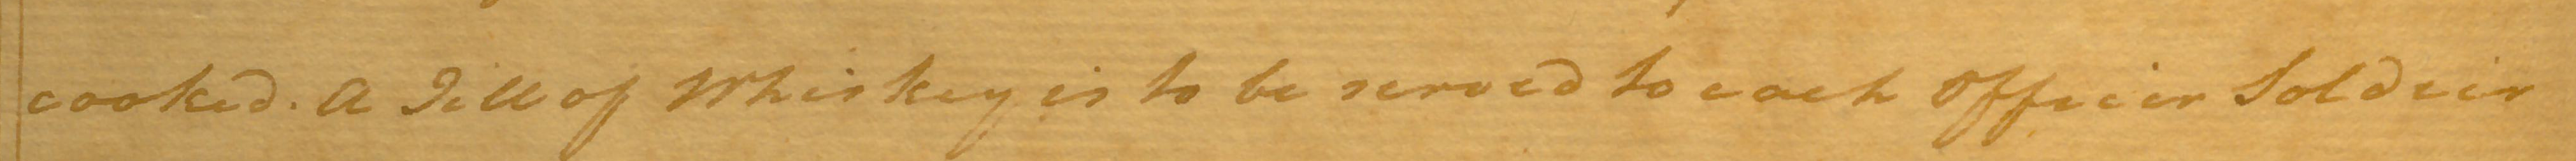cooked. A gill of Whiskey is to be served to each Officer Soldier
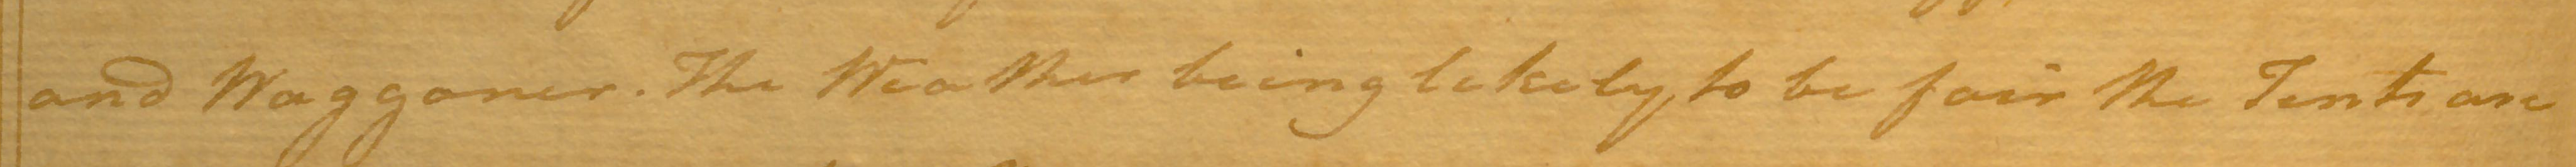and Waggoner. The Weather being likely to be fair the Tents are
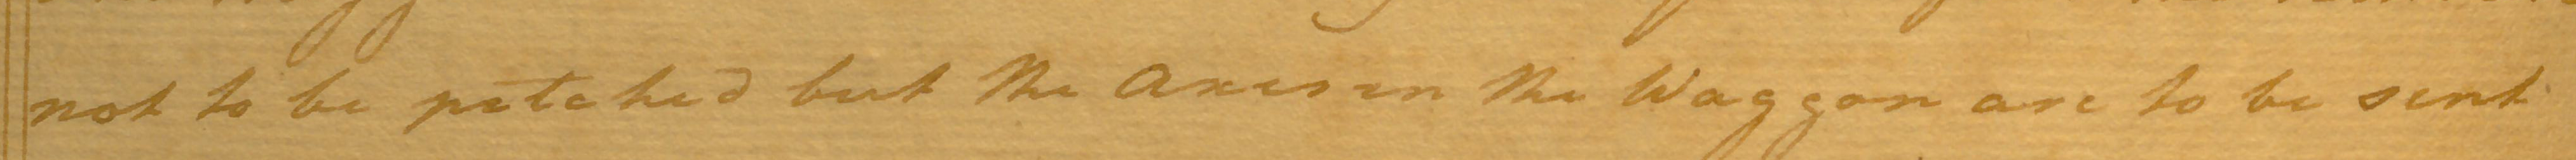not to be pitched but the Axes in the Waggon are to be sent
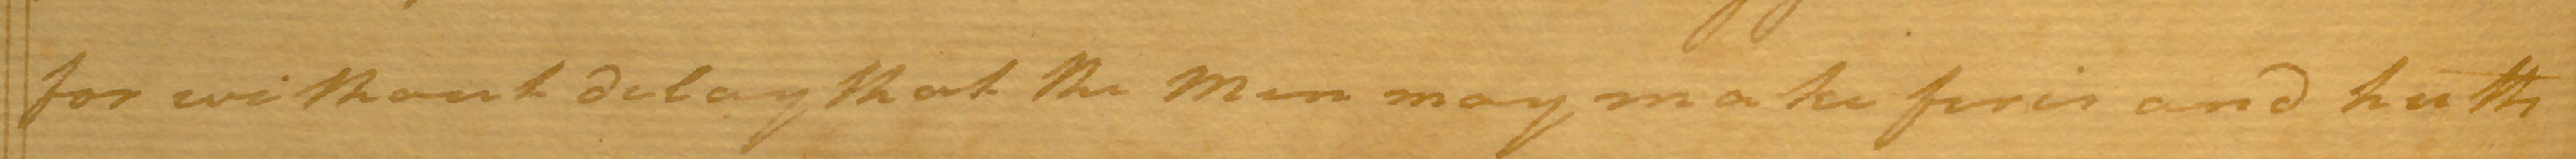for without delay that the men may make fires and hutts
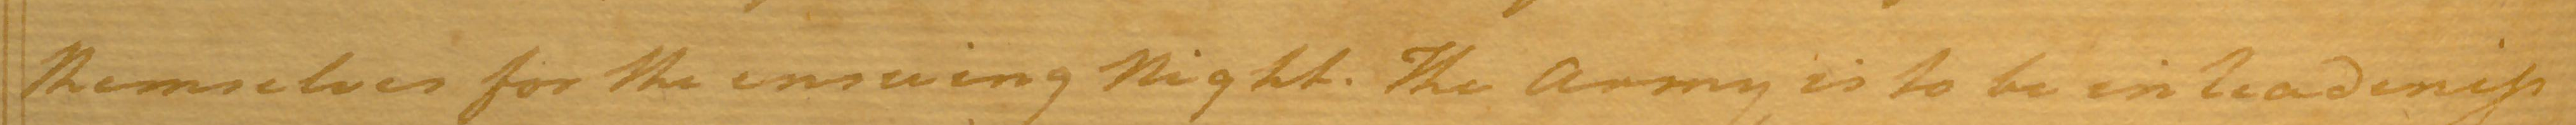themselves for the ensuing Night. The Army is to be in readiness
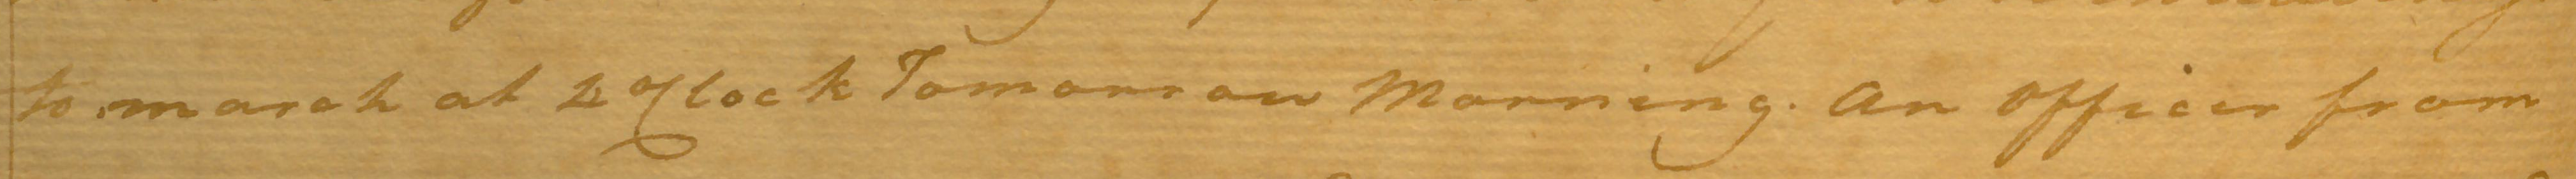to march at 4 ^oClock tomorrow Morning. An officer from
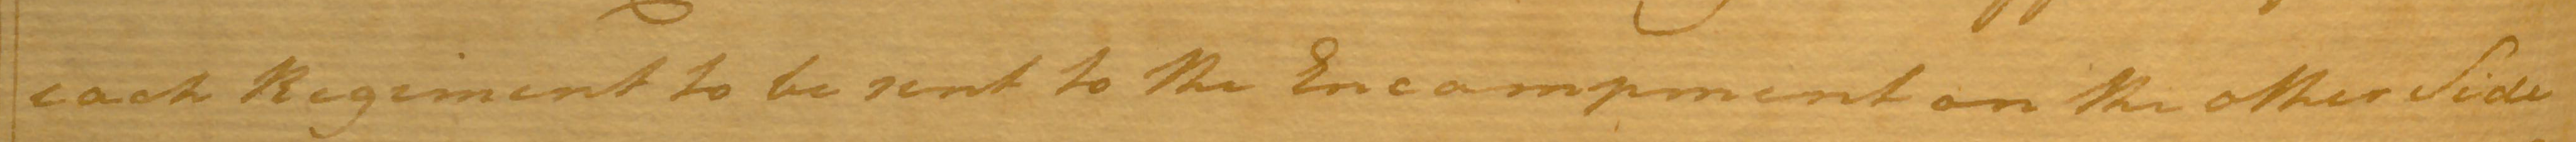each Regiment to be sent to the Encampment on the other Side
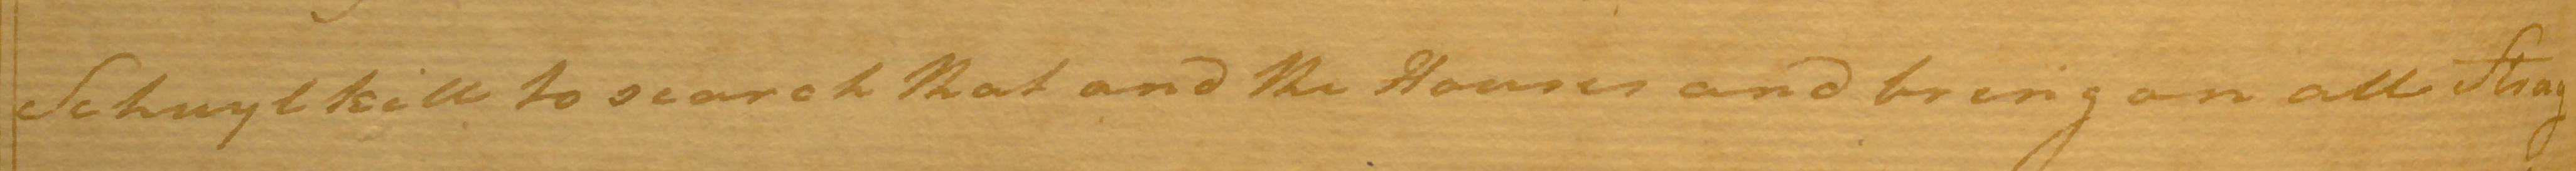Schuylkill to search that and the Houses and bring in all Strag
